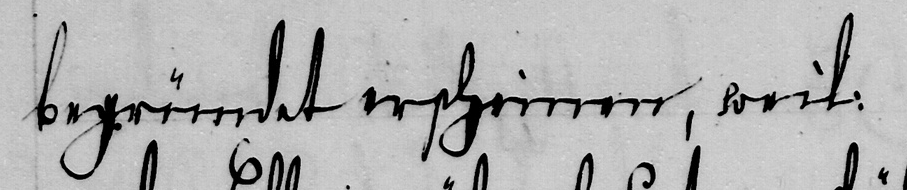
begründet erscheinen, weil:
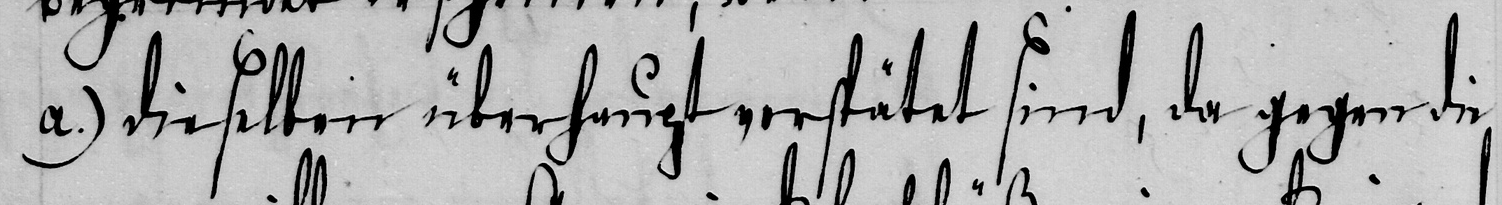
a.) dieselben überhaupt verspätet sind, da gegen die
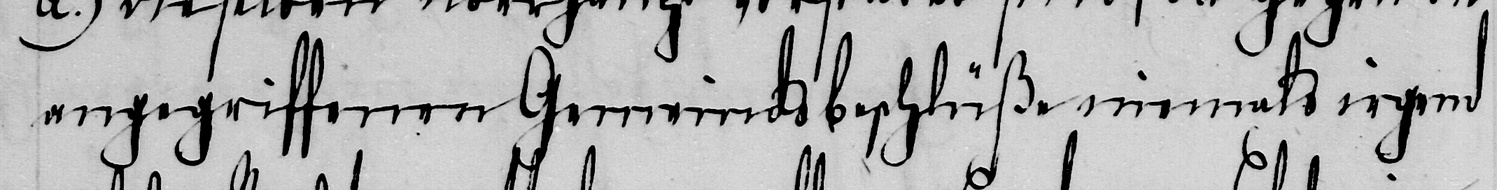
angegriffenen Gemeindsbeschlüße niemals irgend
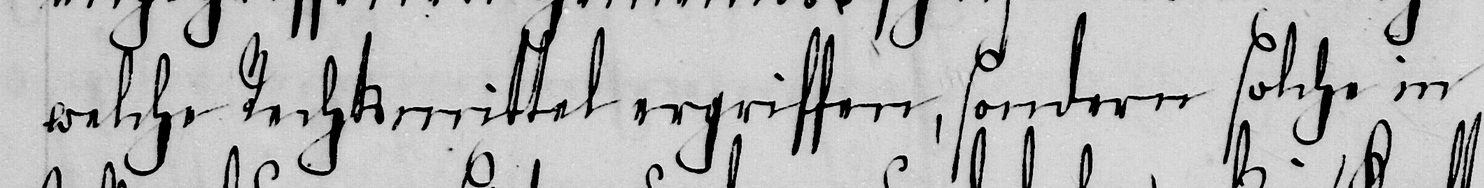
welche Rechtsmittel ergriffen, sondern solche in
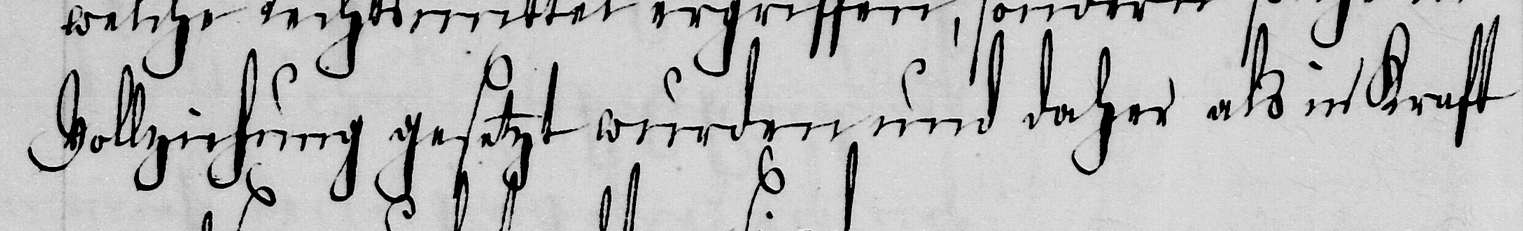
Vollziehung gesetzt wurden und daher als in Kraft
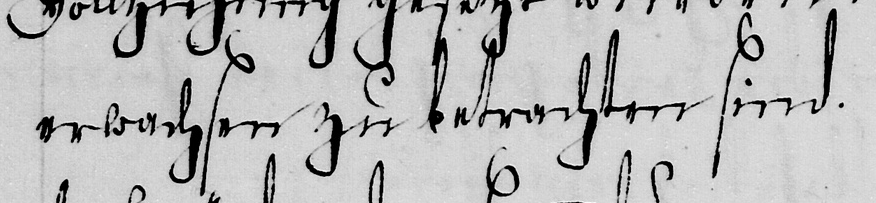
erwachsen zu betrachten sind.
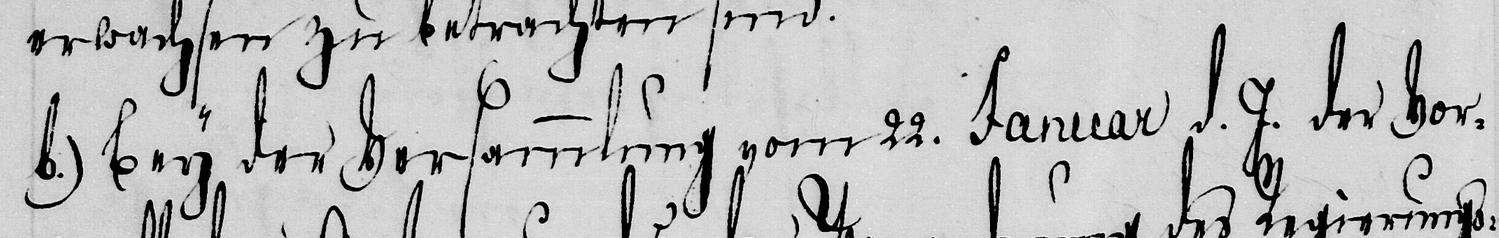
b.) Sey der Versammlung vom 22. Januar d. J. der Vor¬
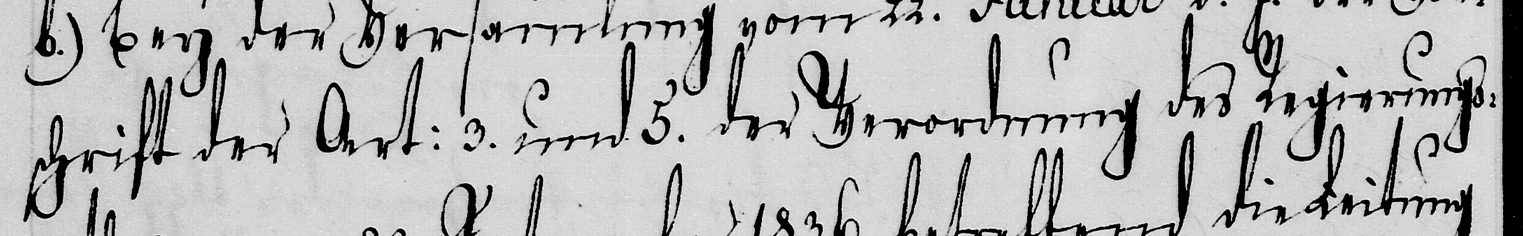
chrift der Art: 3. und 5. der Verordnung des Regierungs¬
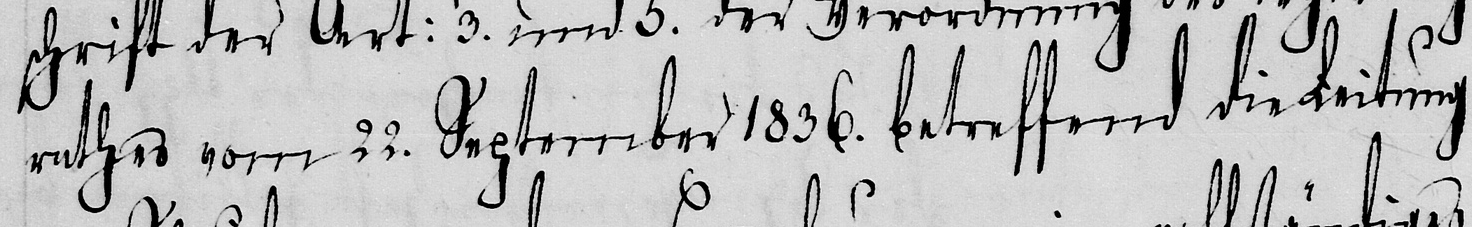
rathes vom 22. September 1836. betreffend die Leit¬
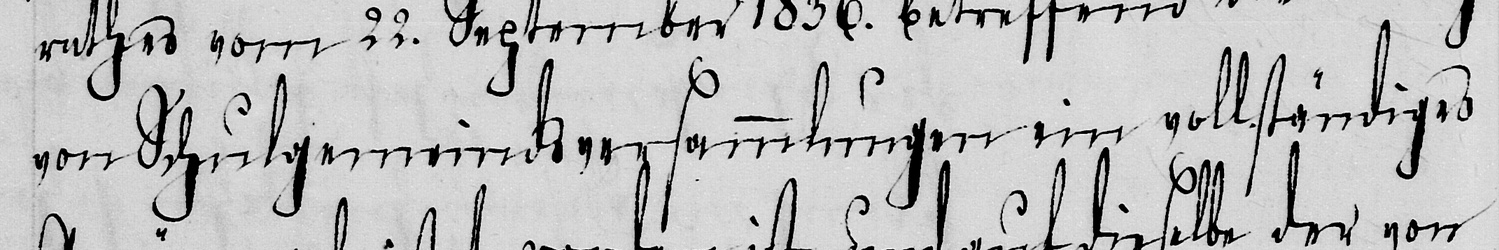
von Schulgemeindsversammlungen ein vollständiges
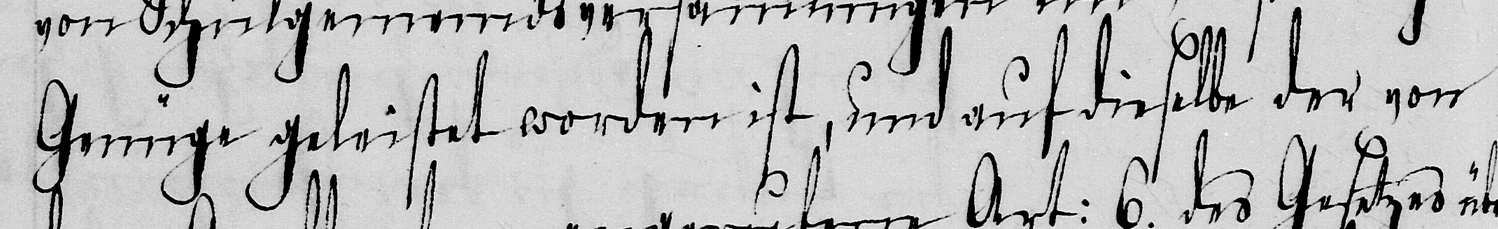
Genüge geleistet worden ist, und auf dieselbe der von
